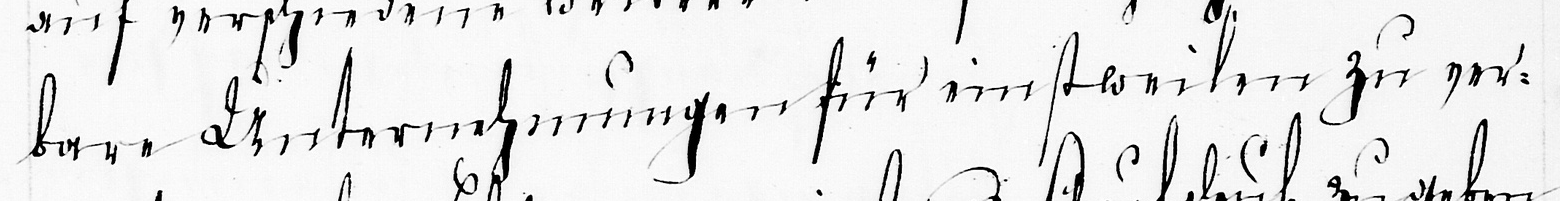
bare Unternehmungen für einstweilen zu ver¬
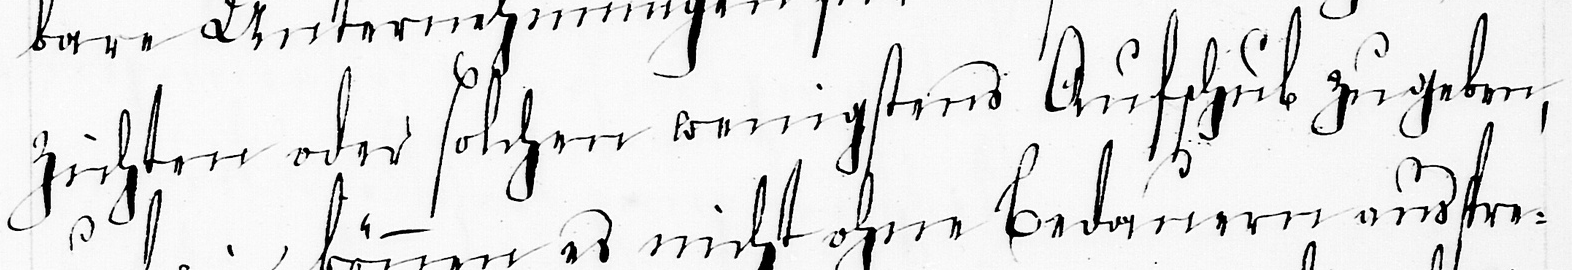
zichten oder solchen wenigstens Aufschub zu geben,
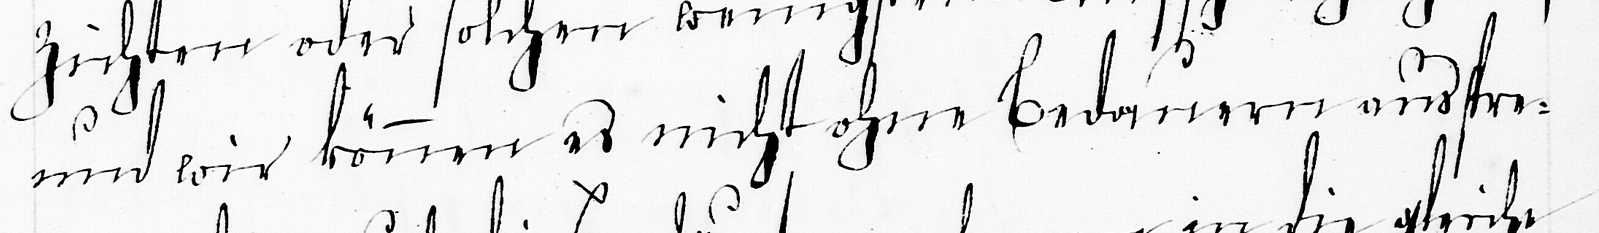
und wir können es nicht ohne Bedauern ausspre¬
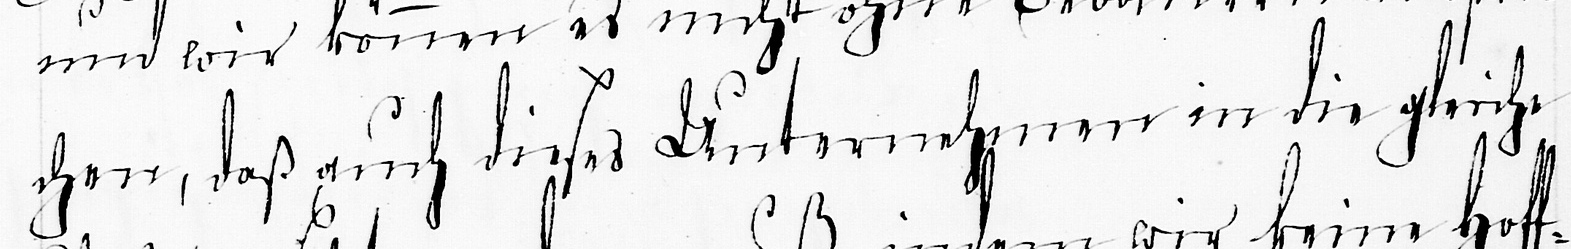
chen, daß auch dieses Unternehmen in die gleiche
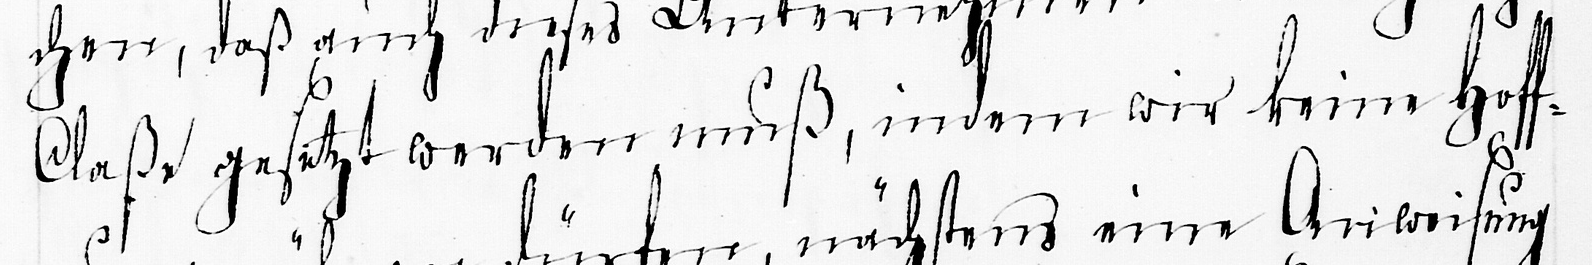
Claße gesetzt werden muß, indem wir keine Hoff¬
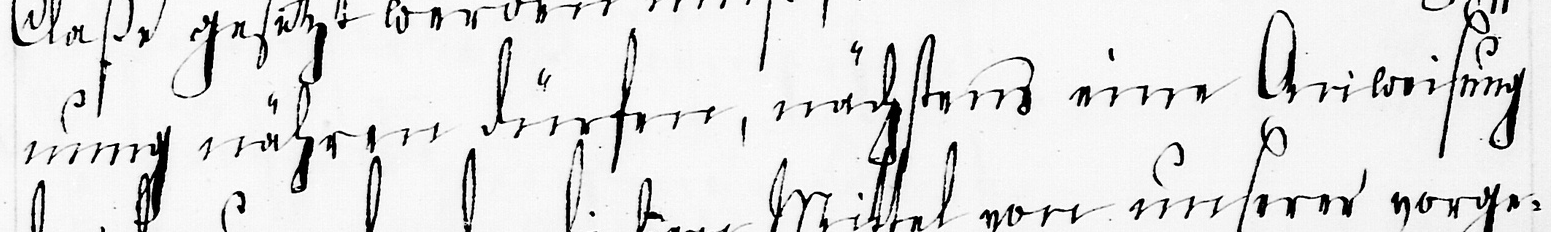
nung nähren dürfen, nächstens eine Anweisung
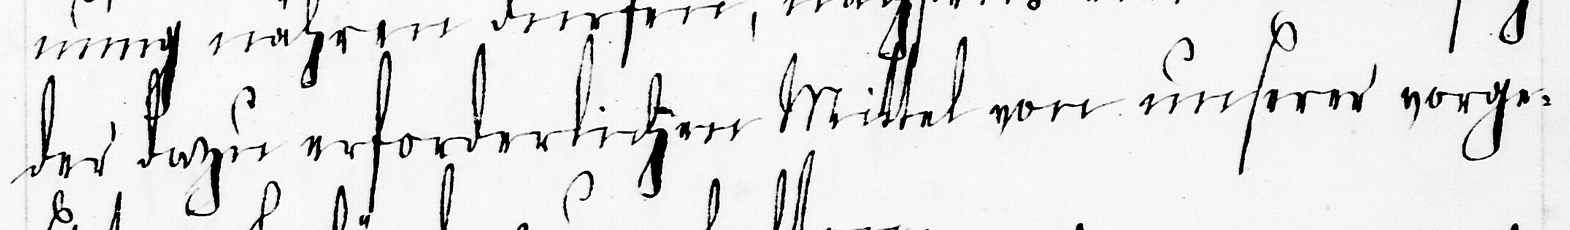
der dazu erforderlichen Mittel von unserer vorge¬
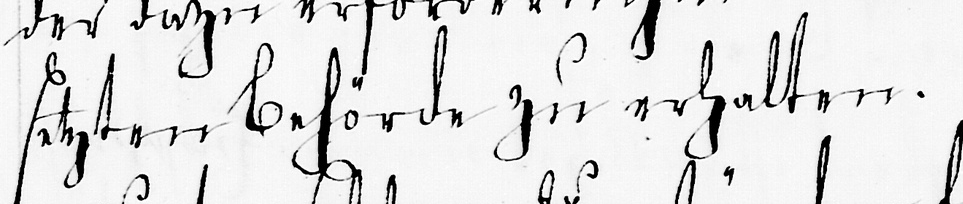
setzten Behörde zu erhalten.
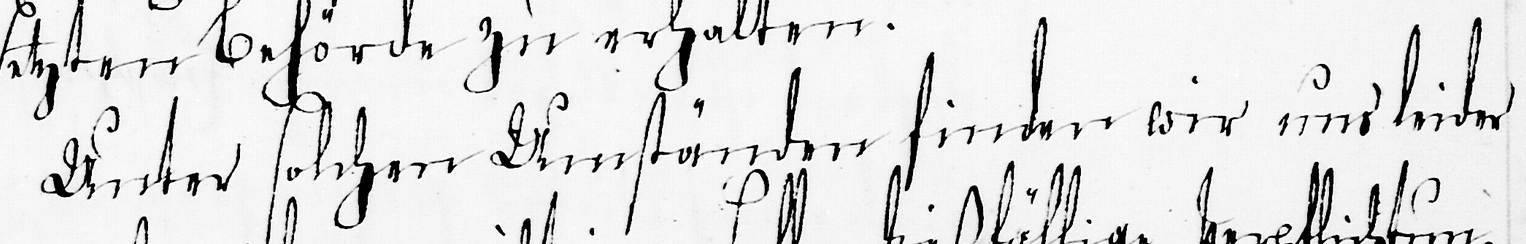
Unter solchen Umständen finden wir uns leider
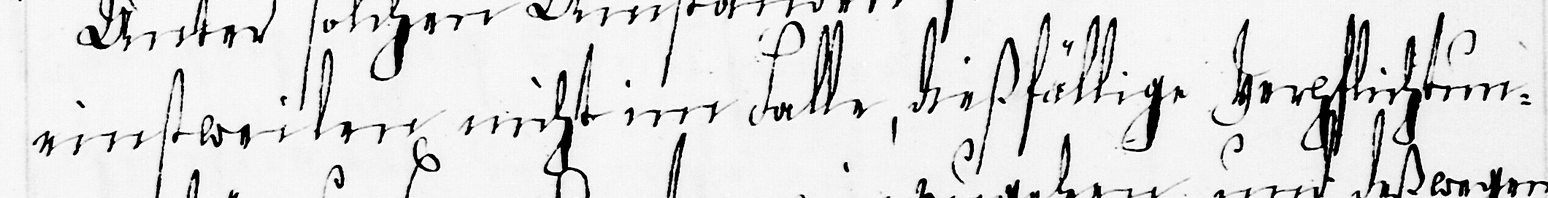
einstweilen nicht im Falle, dießfällige Verpflichtu¬
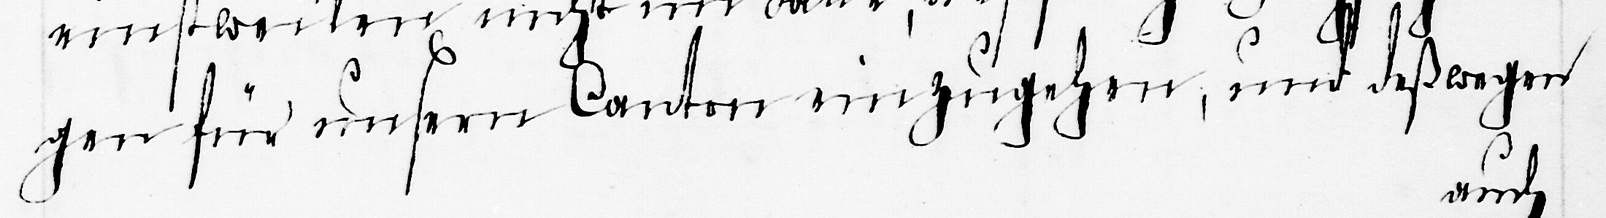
ngen für unsern Canton einzugehen, und deßwegen
